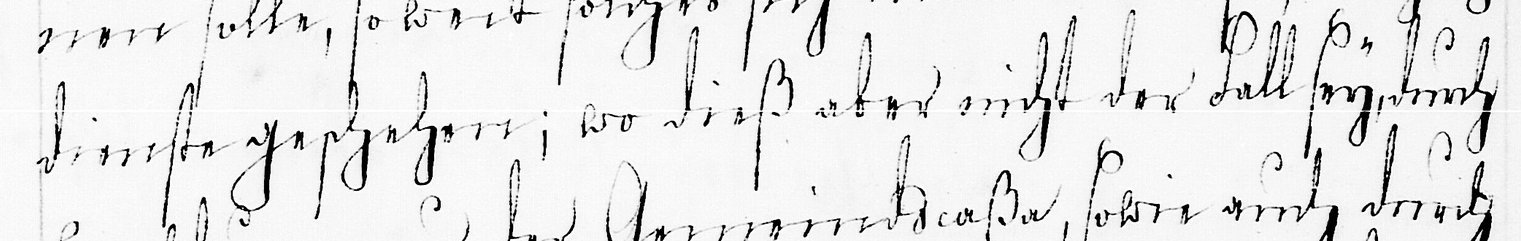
dienste geschehen; wo dieß aber nicht der Fall sey, durch
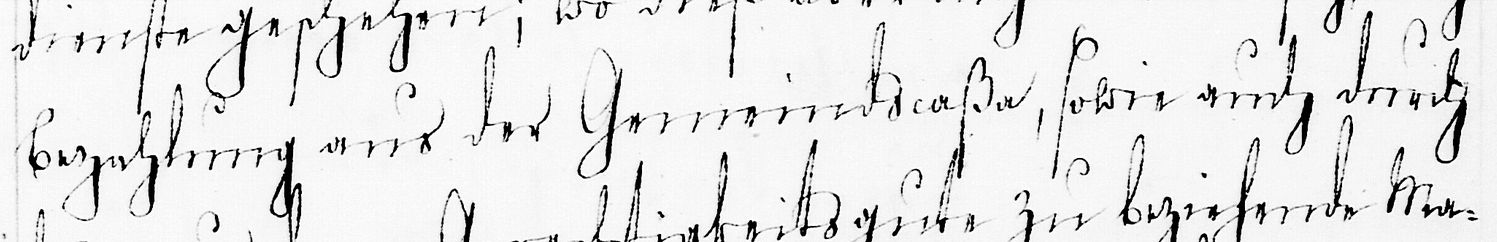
Bezahlung aus der Gemeindscaßa, sowie auch durch
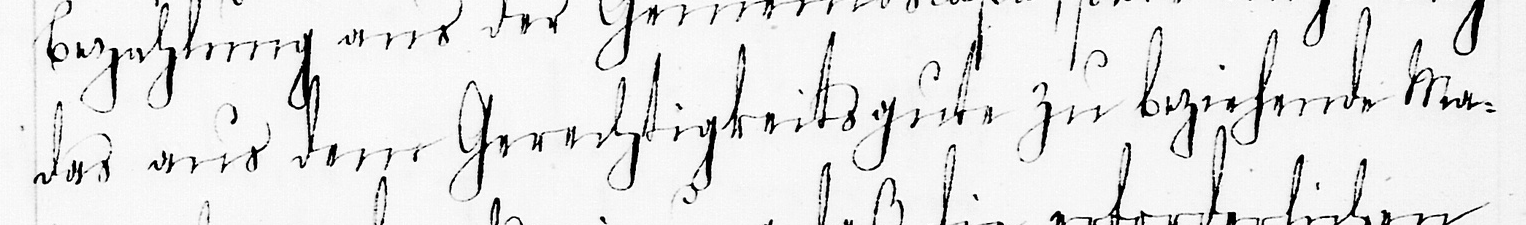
das aus dem Gerechtigkeitsgute zu beziehende Ma¬
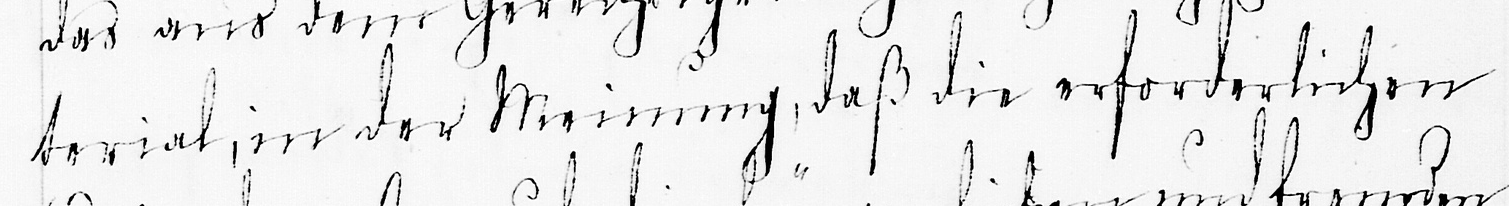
terial, in der Meinung, daß die erforderlichen
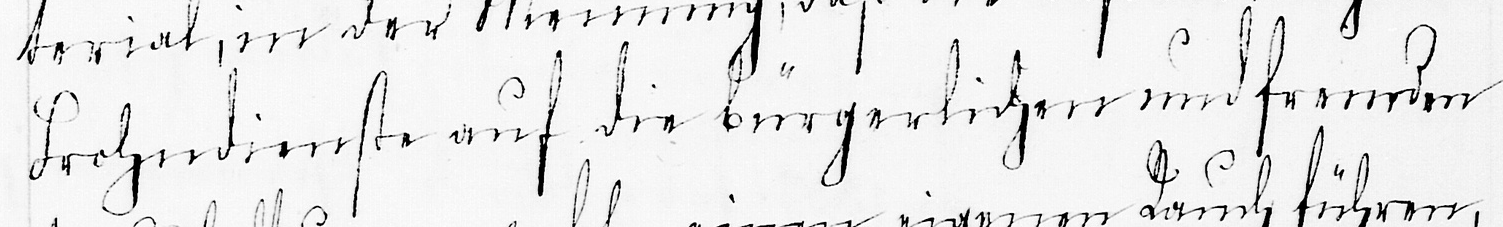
Frohndienste auf die bürgerlichen und fremden
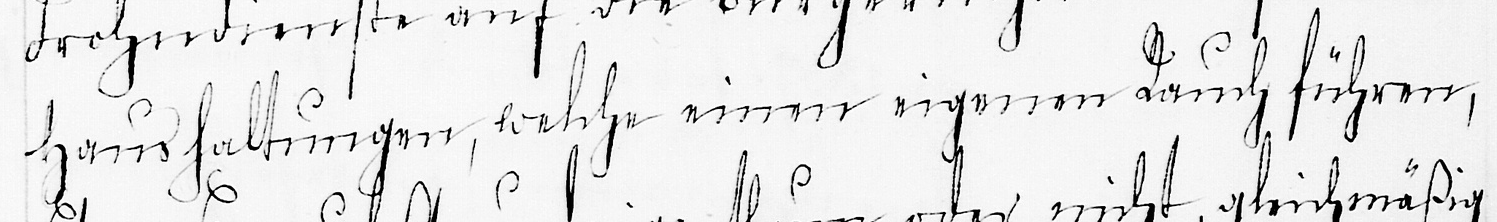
Haushaltungen, welche einen eigenen Rauch führen,
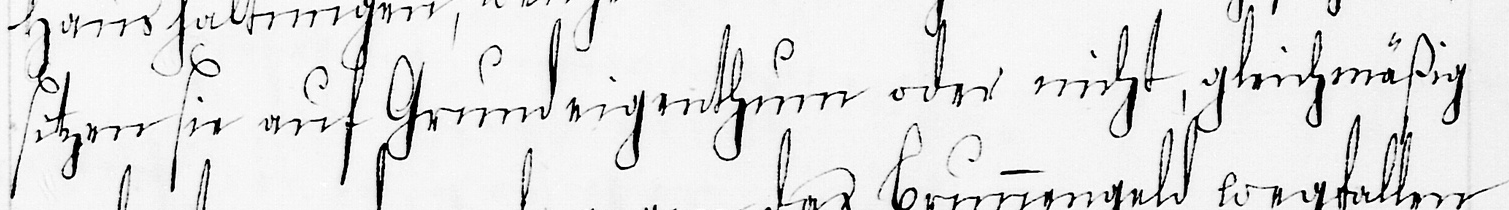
sitzen sie auf Grundeigenthum oder nicht, gleichmäßig
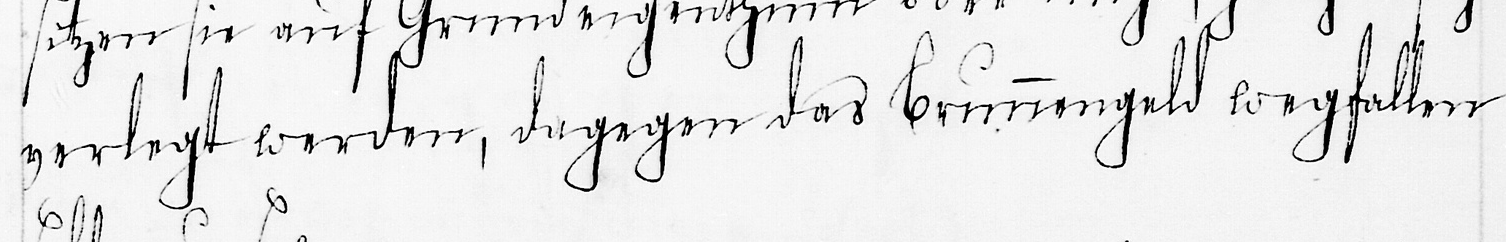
verlegt werden, dagegen das Brunnengeld wegfallen
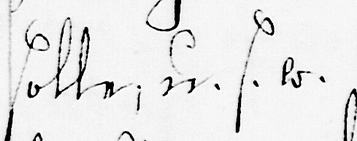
solle, u. s. w.
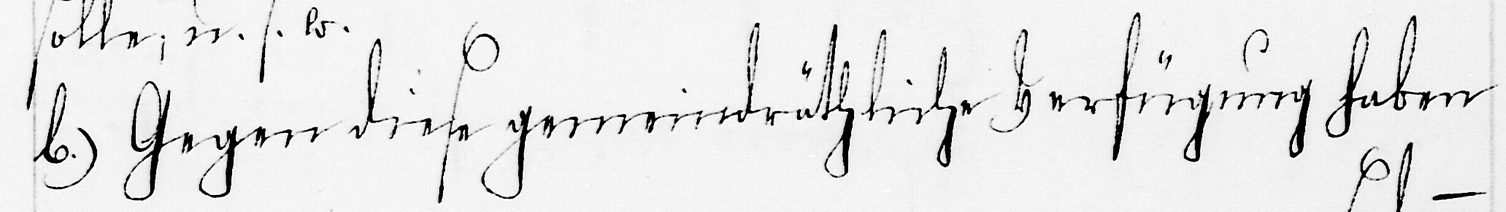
b.) Gegen diese gemeindräthliche Verfügung haben
